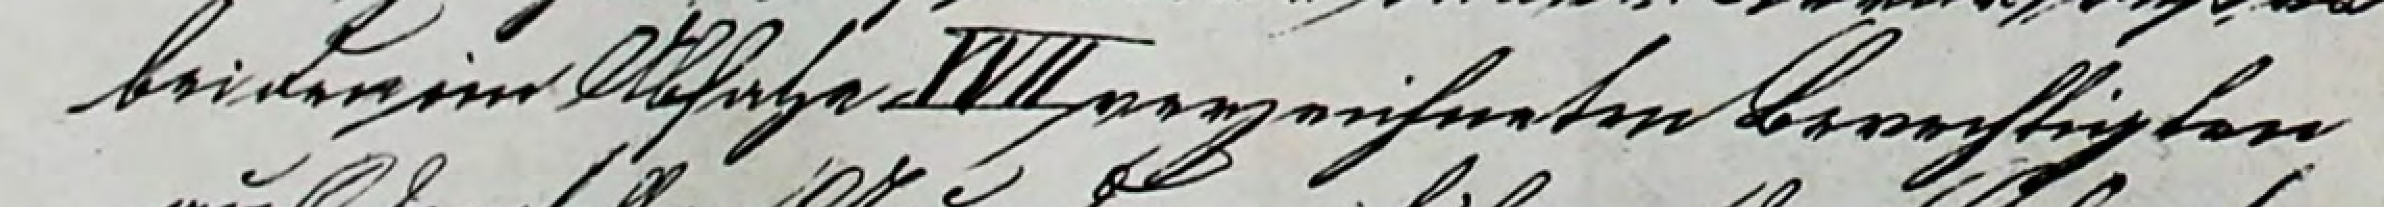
bei den im Absatze XVII verzeichneten Berechtigten
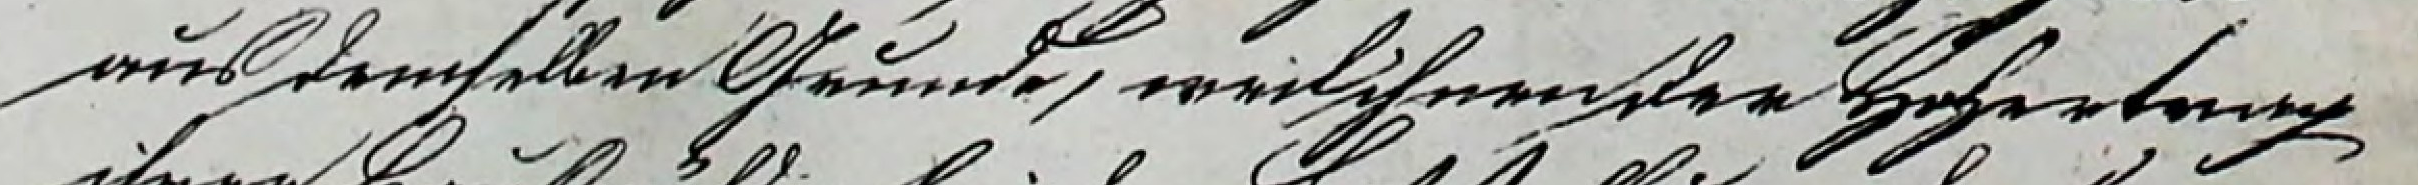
aus demselben Grunde, weil ihnen der Holzertrag
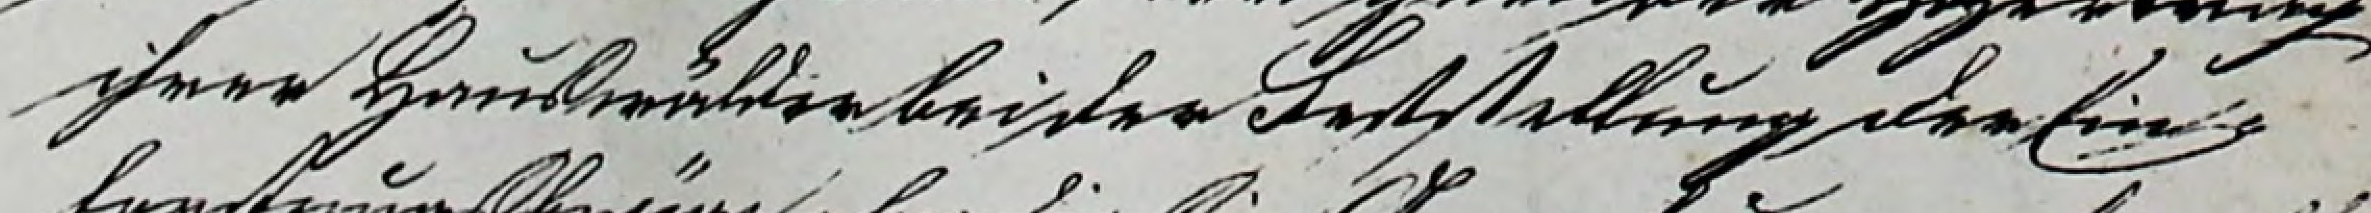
ihrer Hauswälder bei der Feststellung der Ein„
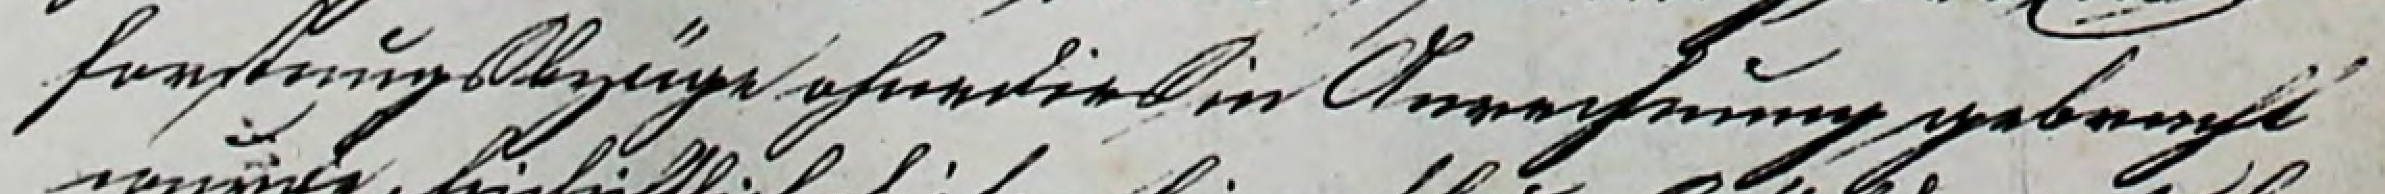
forstung Abzüge ohnedies in Anrechnung gebracht
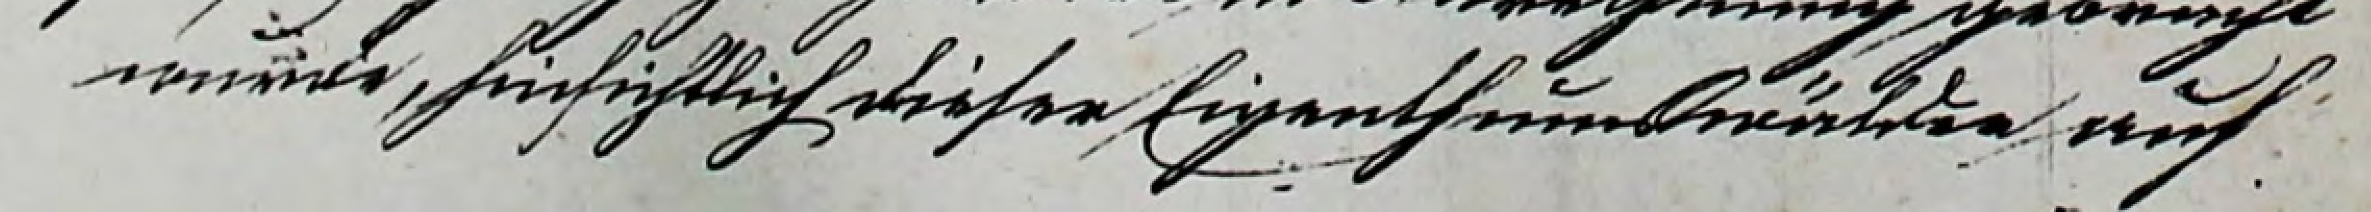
wurde, hinsichtlich dieser Eigenthumswälden auf
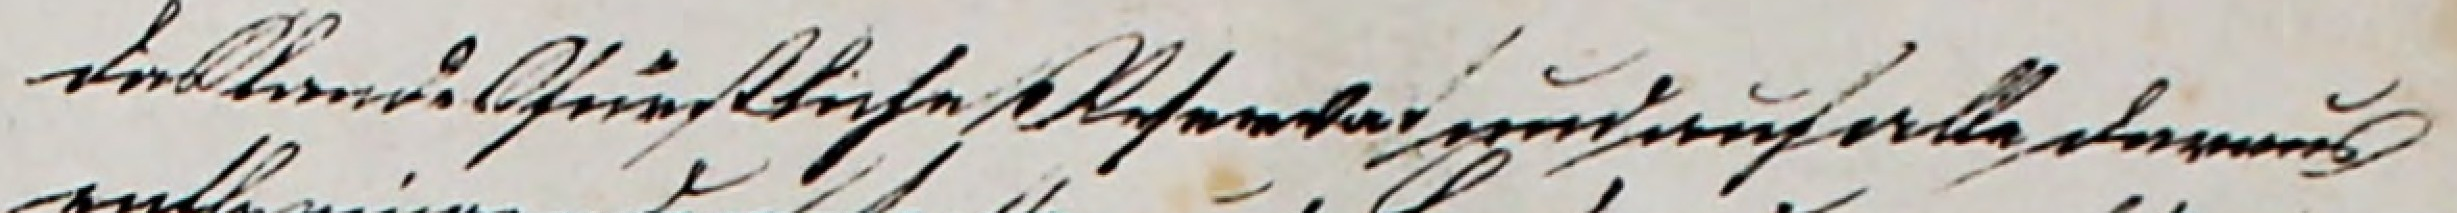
das land. gürstliche Reservat und auf alle daraus
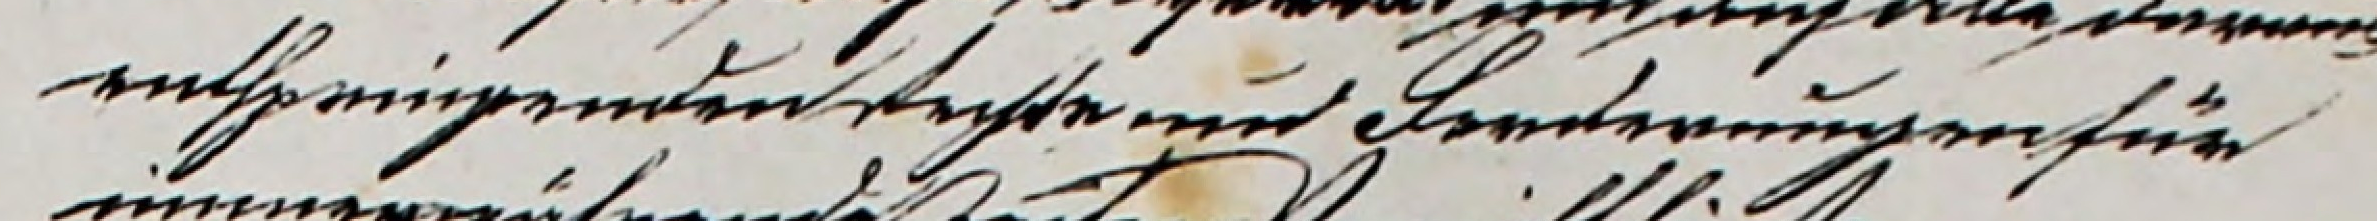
entspringenden Rechte und Forderungen für
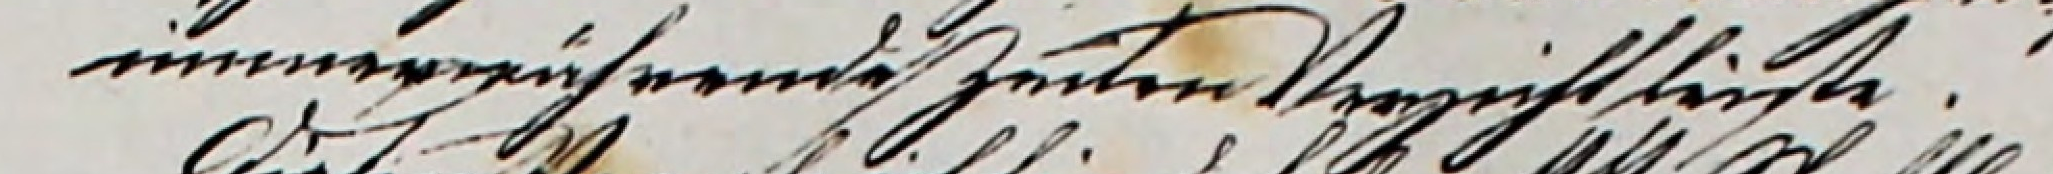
immer rührende Zeiten Verzichtleiste.
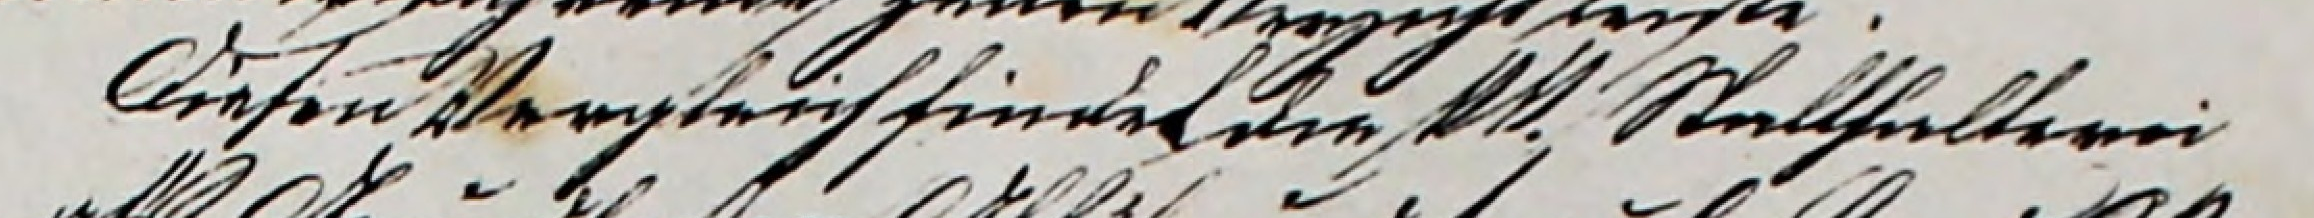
Diesen Vergleich finde den kk. Stallhalterei
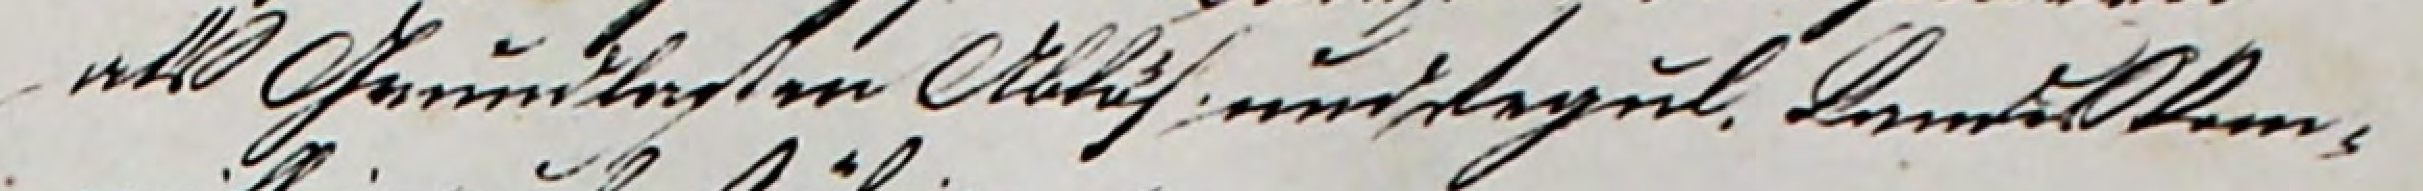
als Grundlasten Abbüh. und Regul. Landeskom„
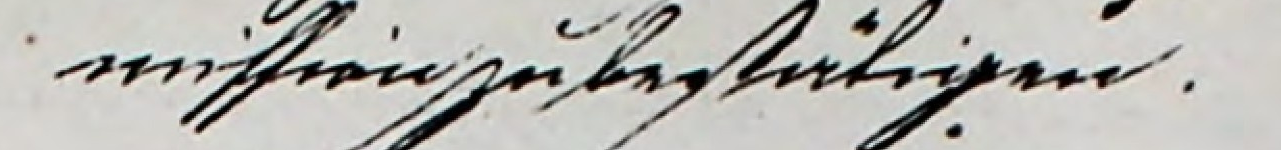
mission zu bestätigen.
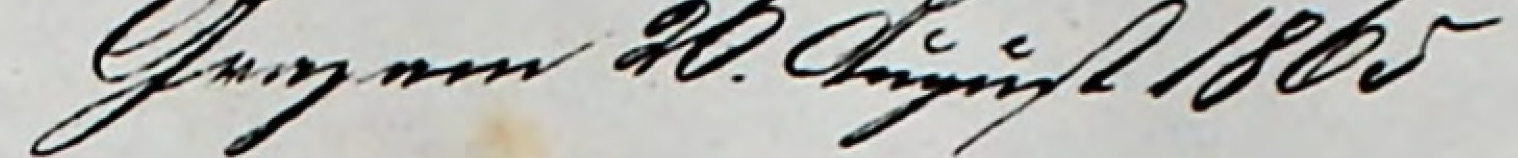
Graz am 26. August 1865
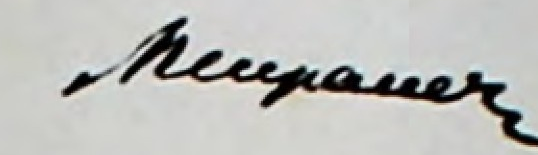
Meupauer
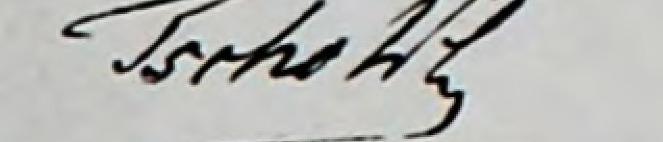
Tsch???
